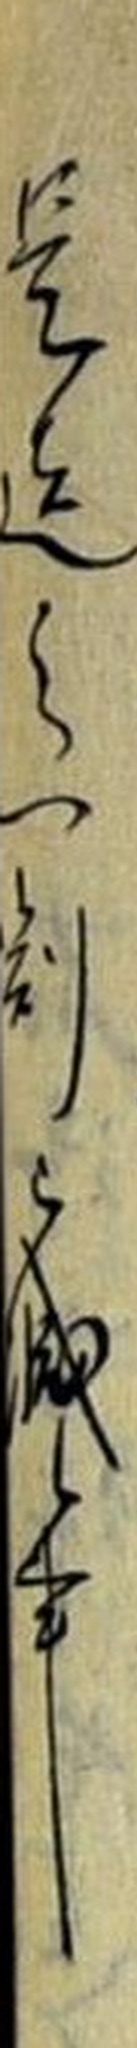是迄之一割被減候事
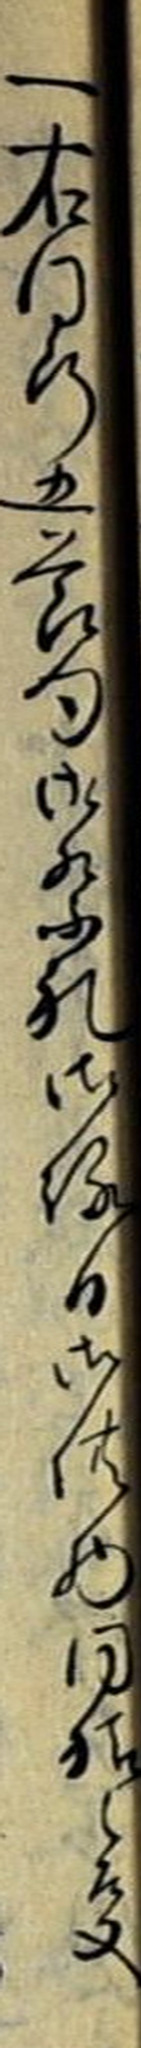一右同断五節句御祭礼御縁日御供物同様之事
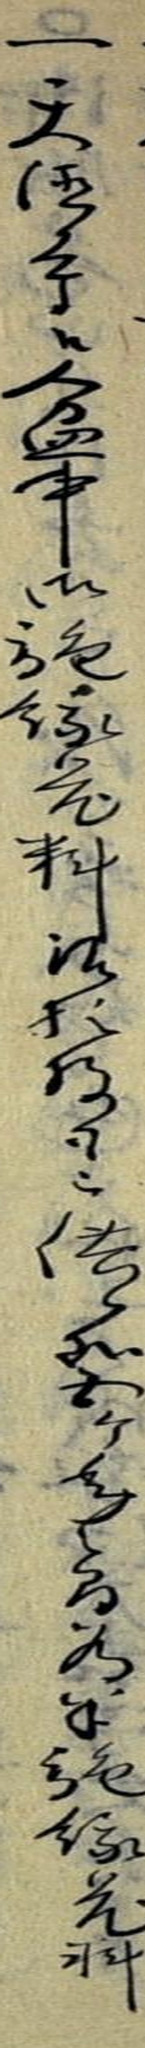一天徳寺江盆中御施餓鬼料銀拾枚つヽ被供候処五ヶ年之間為半施餓鬼料
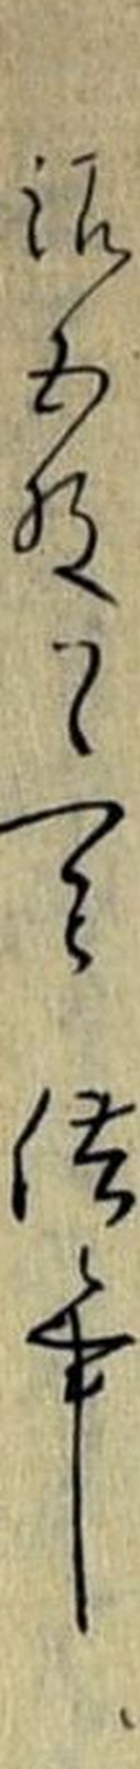銀五枚つヽ可被供候事
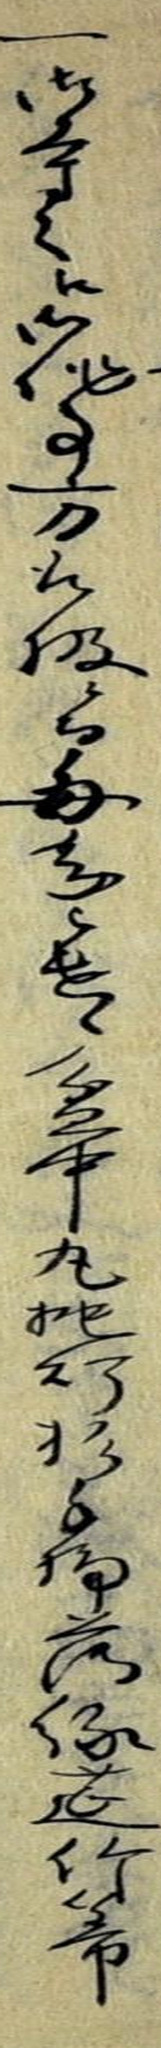一御寺々江御作事方取扱に而毎年被遣候盆中丸桃灯杉手桶薄縁筵竹箒
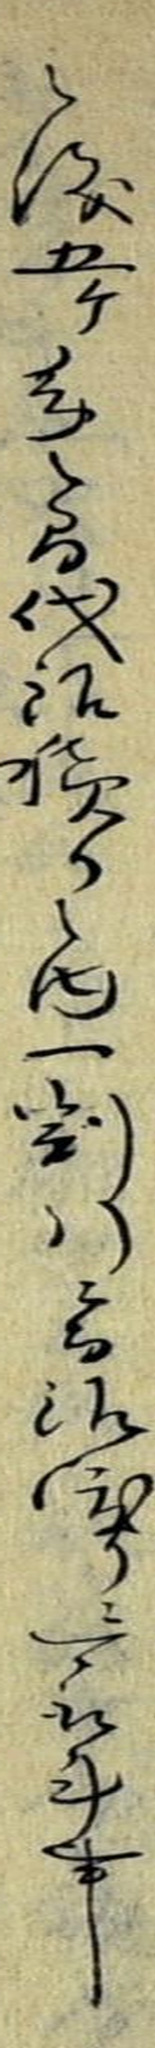之儀五ヶ年之間代銀積り之内一割引に而銀渡りに可取斗事
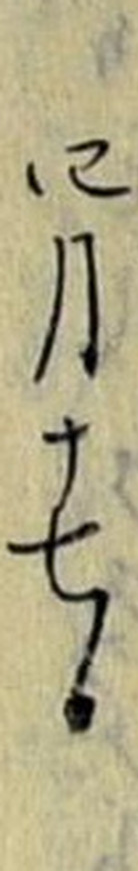四月十七日
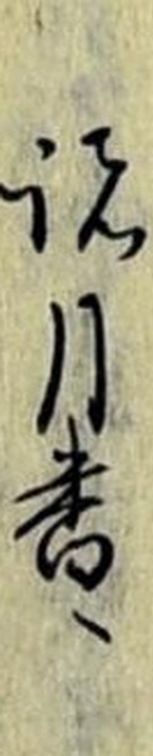諸月番へ
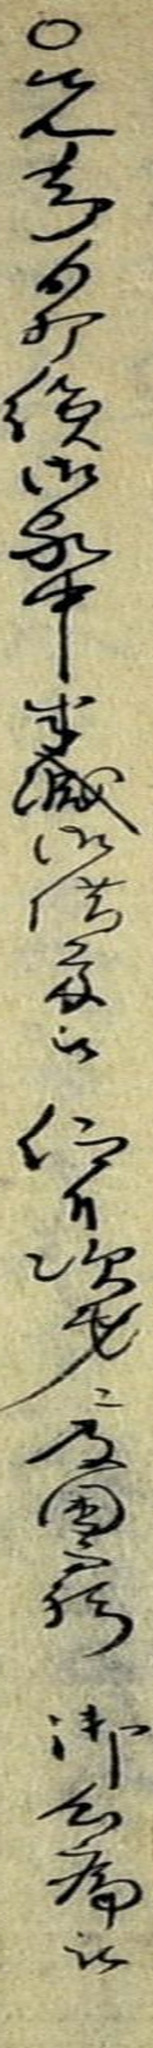一先年ゟ打続御家中減御借米被仰付次第に及困窮御心痛被
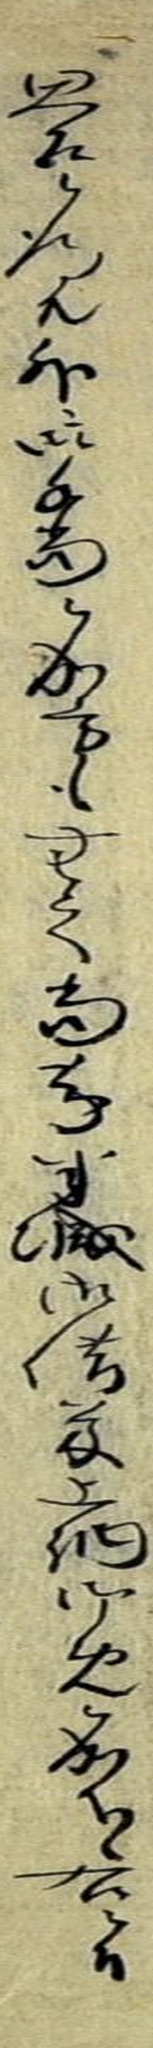思召に候得共外に御手当被成方も無之当年半減御借米上納御免被成下候右に付
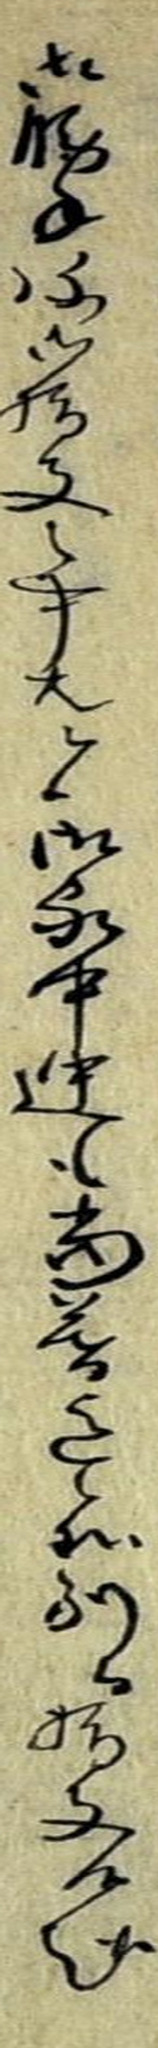御勝手弥御指支候事共に候御家中迚も当暮迄之処別而指支候趣
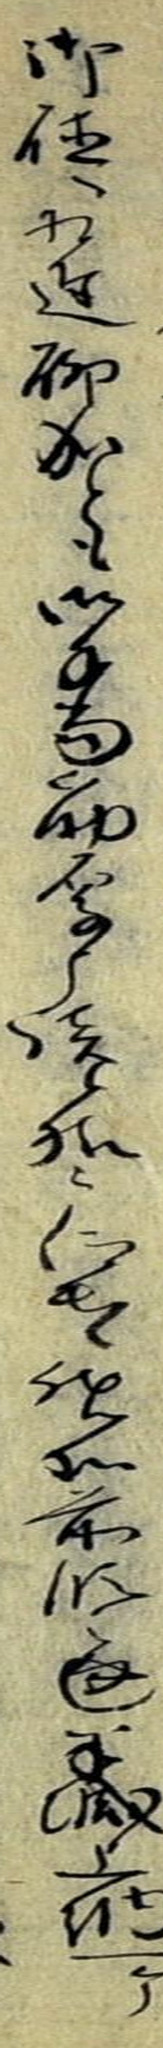御聴へ相達聊成とも御手当筋厚申談候様被仰出候然ル処前段之通半減上納一ヶ
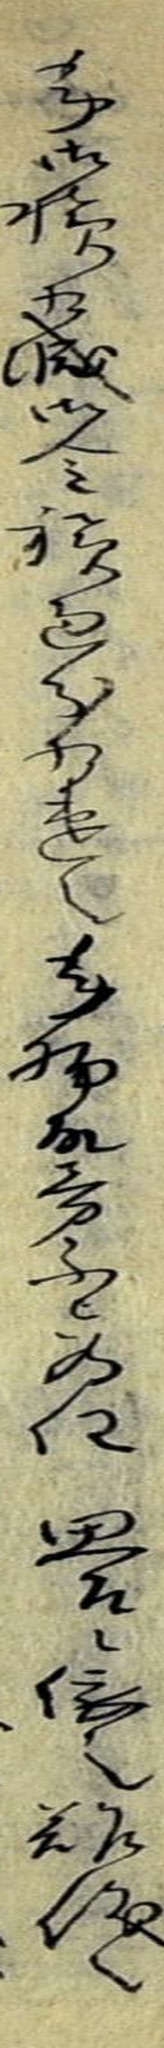年御積相減御金積過分相遣之年柄故旁不被為任思召候依之難儀之
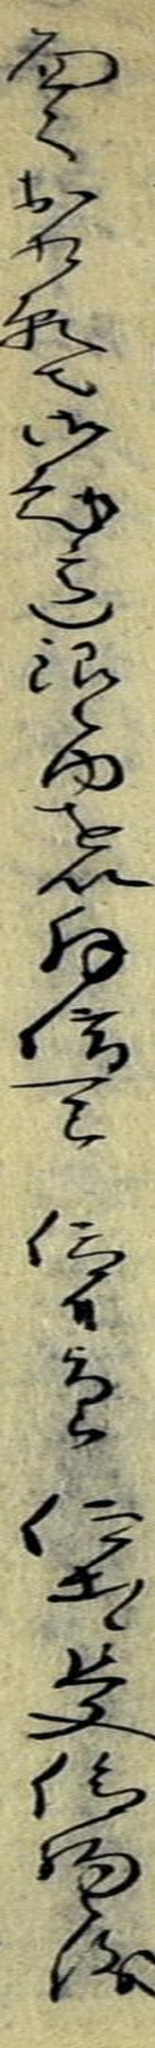面々於相願は御趣意銀之内を以拝借可被仰付旨被仰出候且又倹約之儀
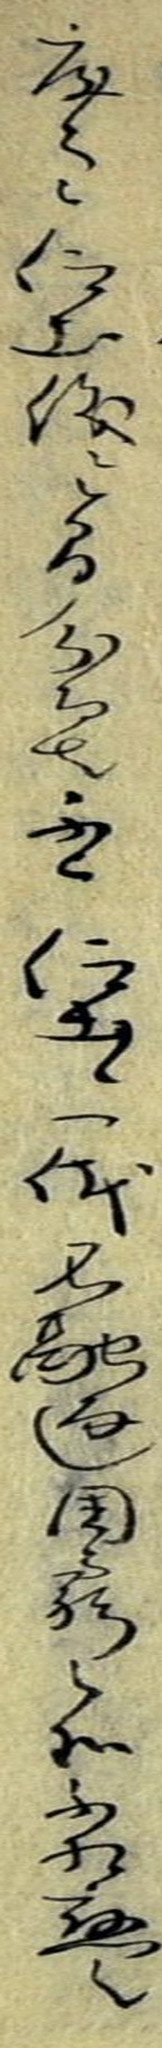度々被仰出儀に候間分而は不被仰出候一体不融通困窮之処不相応之
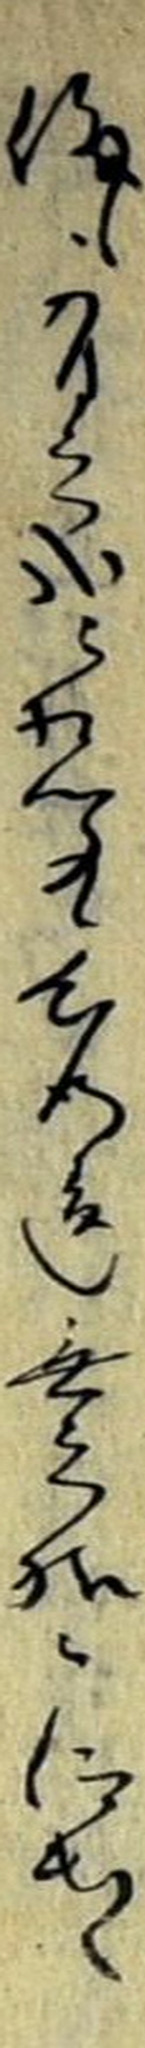儀も有之哉被相聞候心得違無之様被仰出候
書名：命令之部 四
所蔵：福井県文書館 Fukui Prefectural Archives
